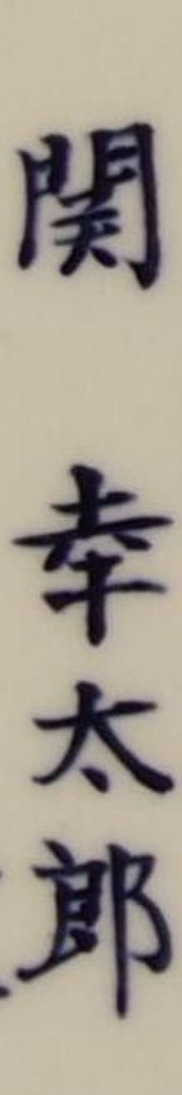関幸太郎
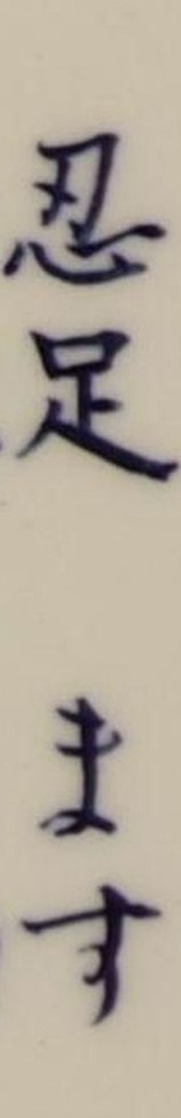忍足ます
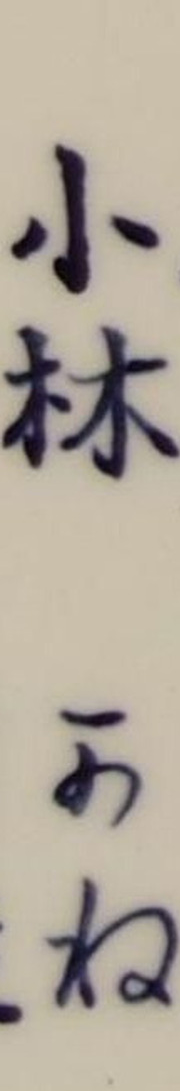小林かね

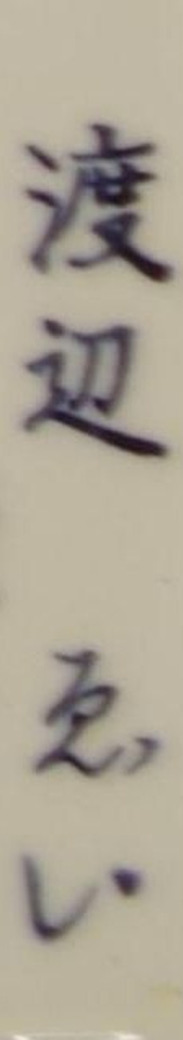渡辺ゑい
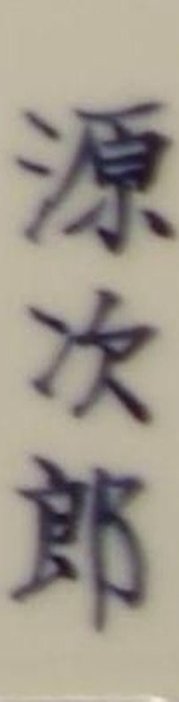源次郎
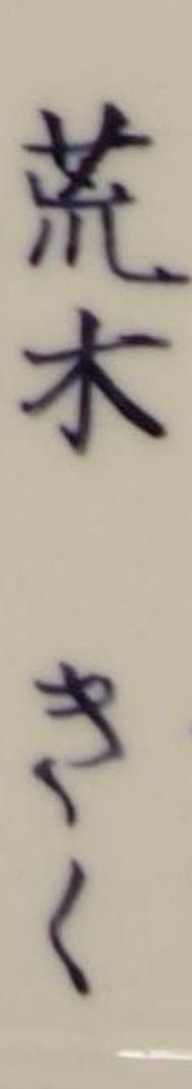荒木きく
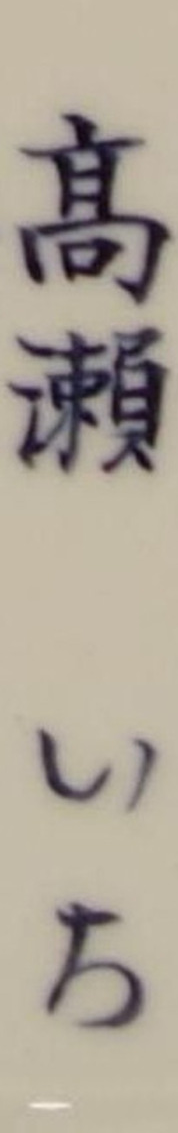高瀬いち
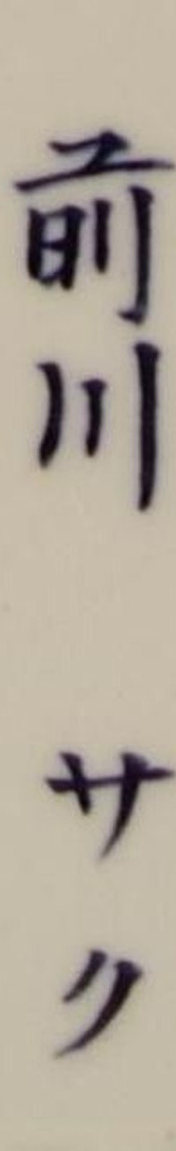前川サク
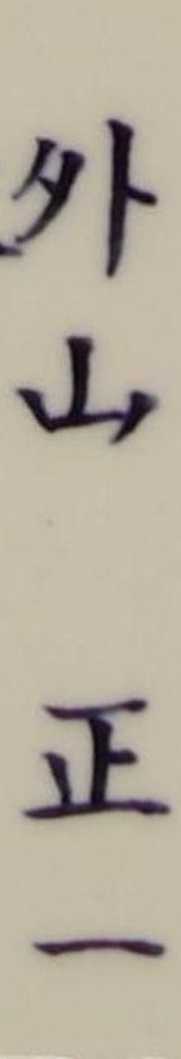外山正一
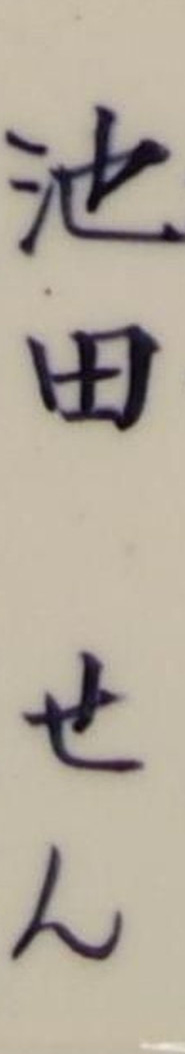池田せん
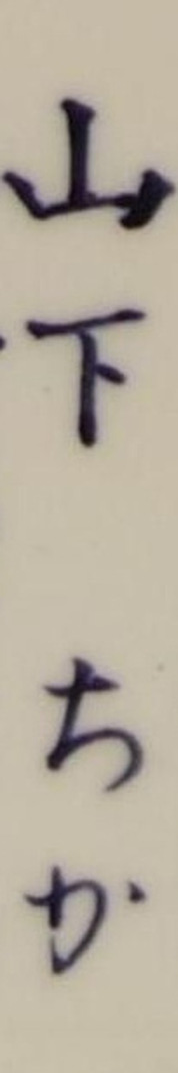山下ちか
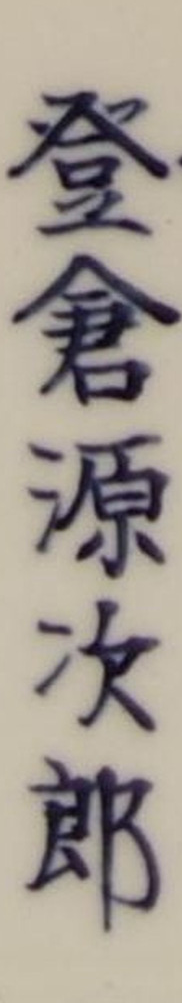登倉源次郎
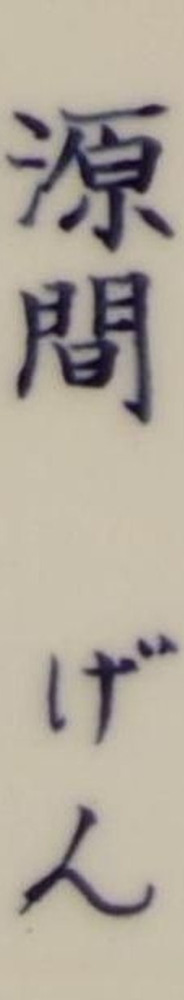源間げん
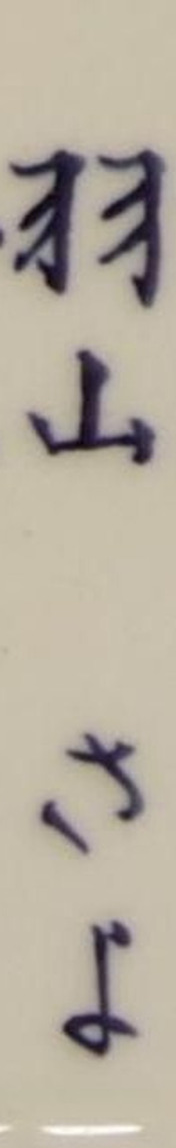羽山さよ
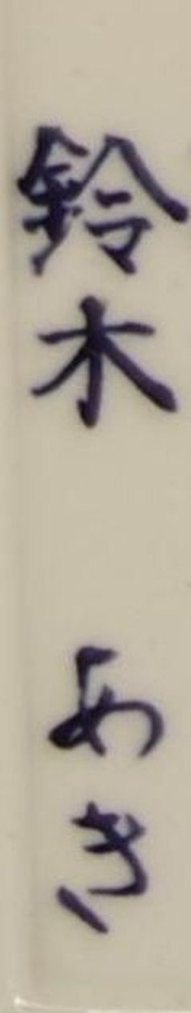鈴木あき

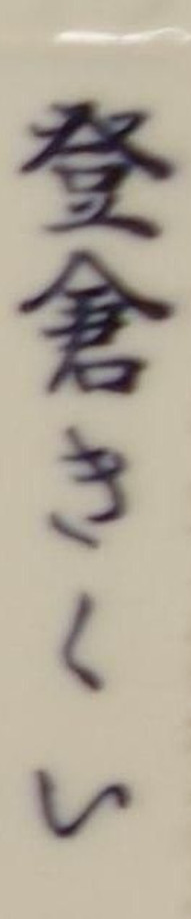登倉きくい
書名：M~S
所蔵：高野山金剛峯寺
